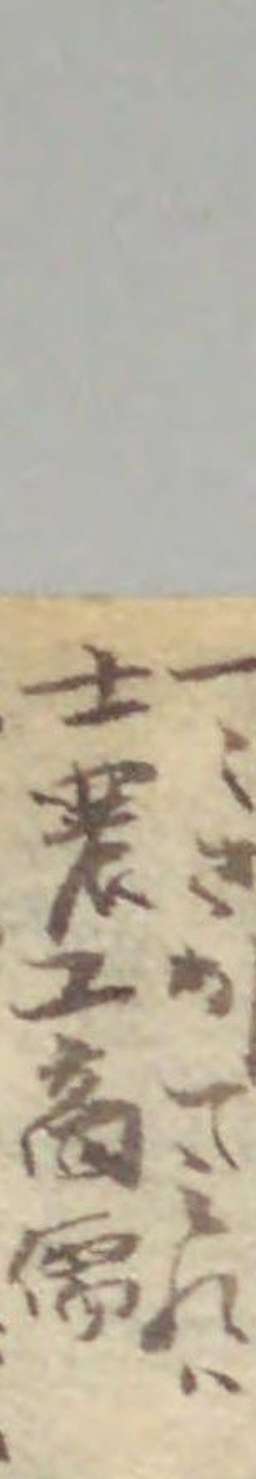士農工商儒
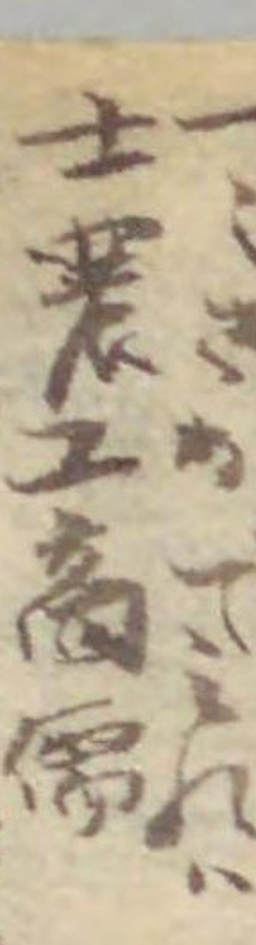士農工商儒
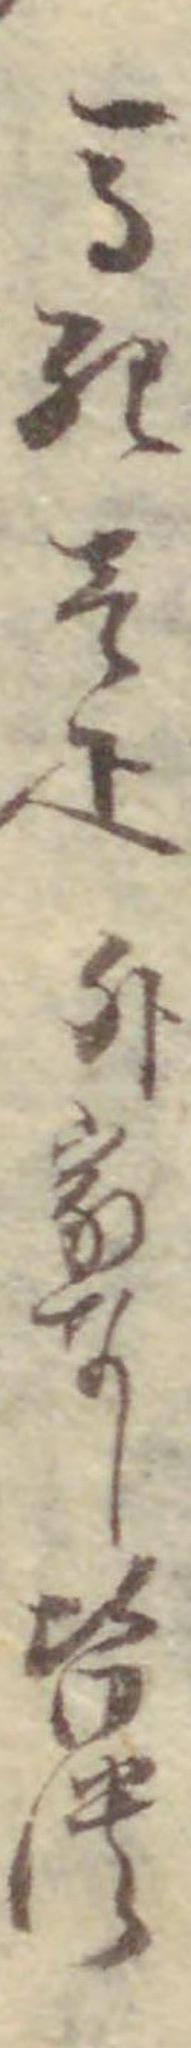馬死壱疋外家なし皆潰
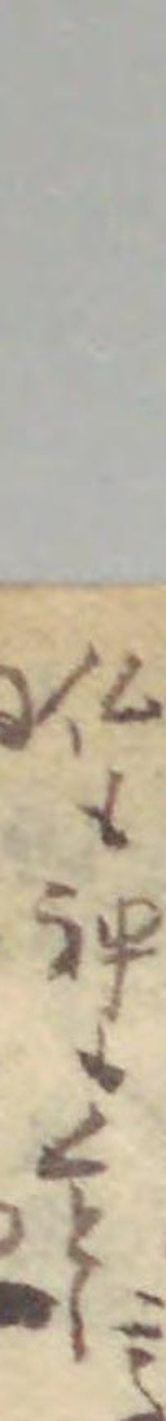仏も神もくとく

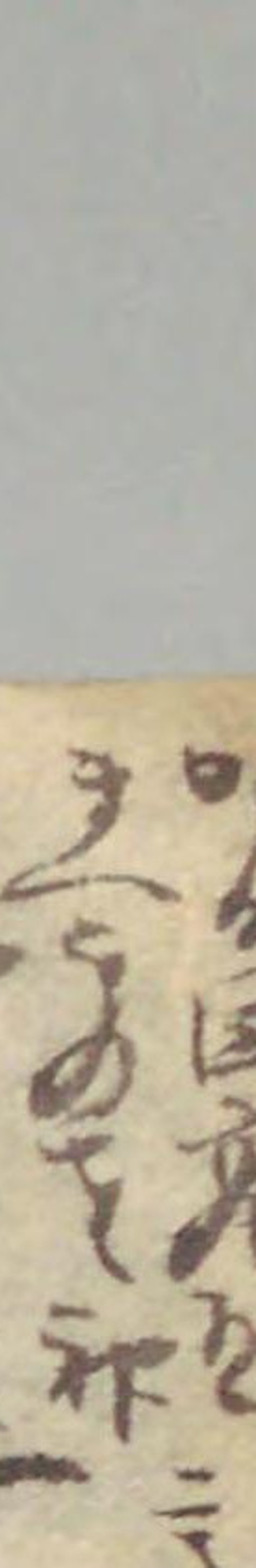まへものを神
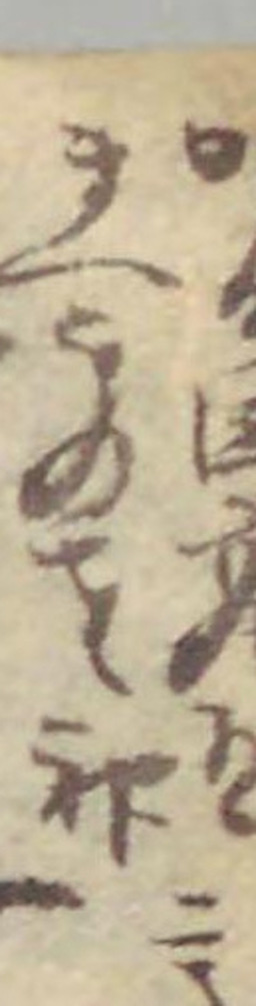まへものを神
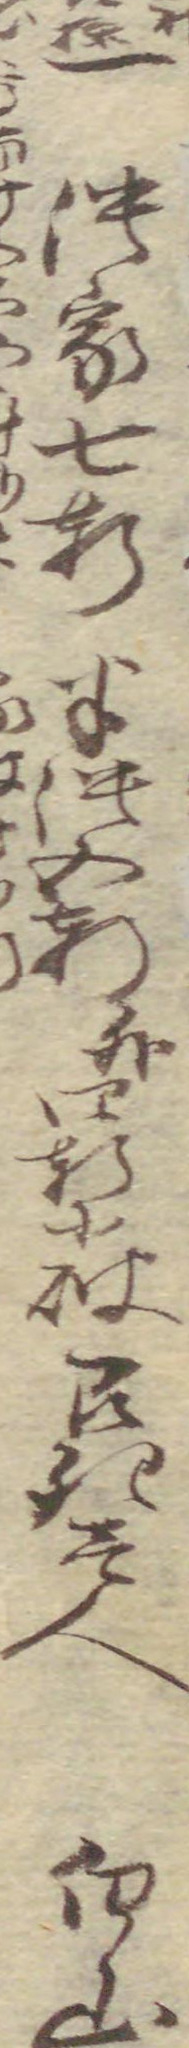一潰家七軒半潰五軒外四軒小破即死壱人白山新田
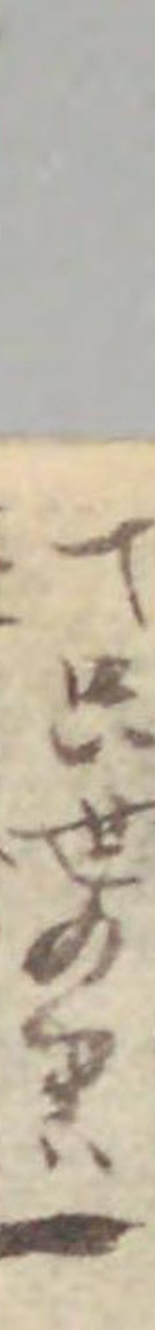て只世の中ハ
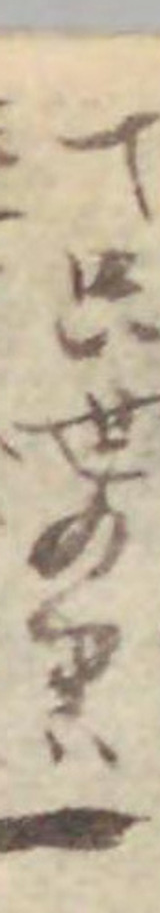て只世の中ハ
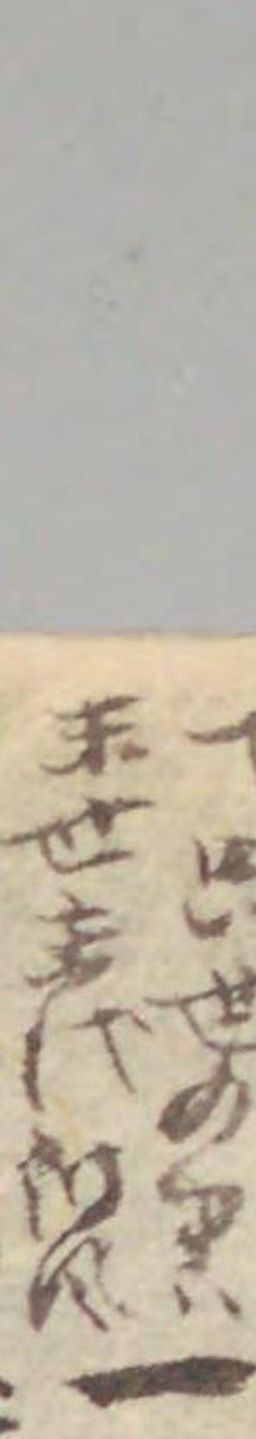来世末代波風
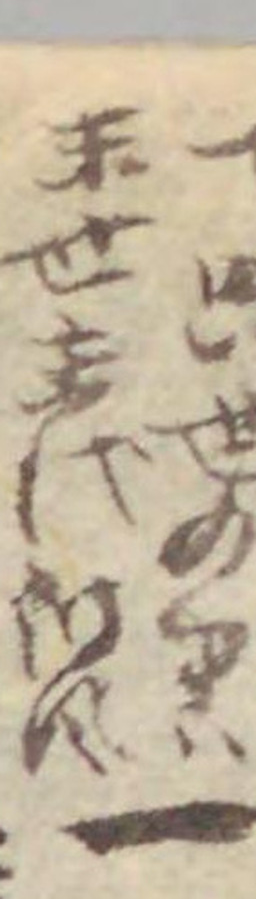来世末代波風
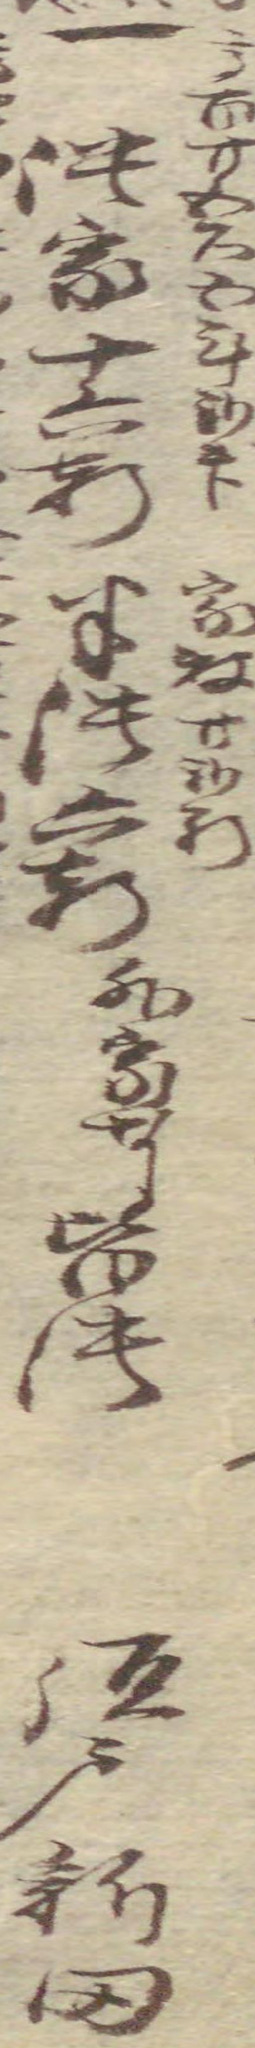一潰家十六軒半潰六軒外家なし皆潰須戸新田
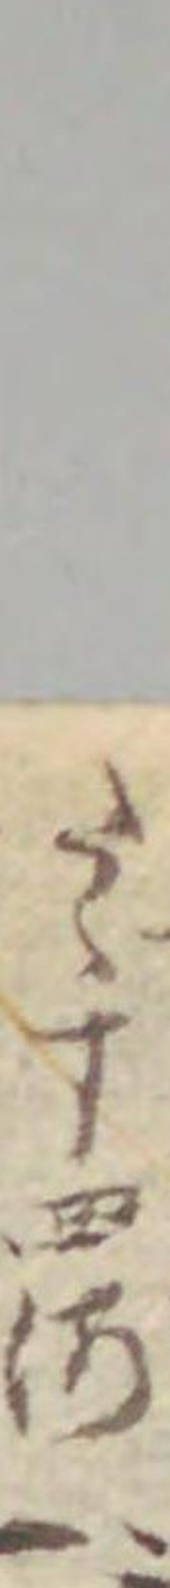たゝす四海
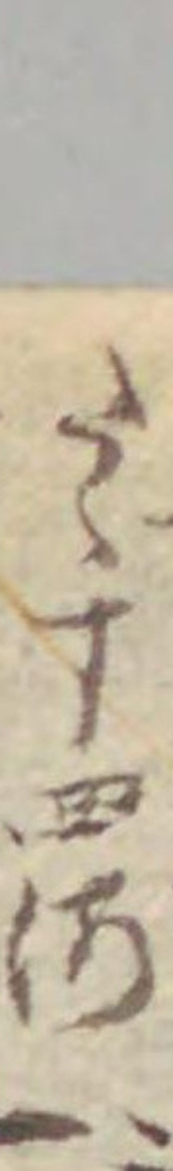たゝす四海
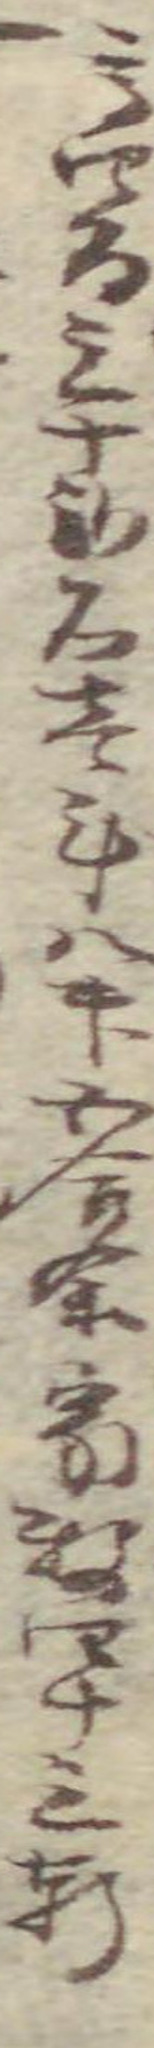高四百三十弐石壱斗八升五合余家数四十三軒
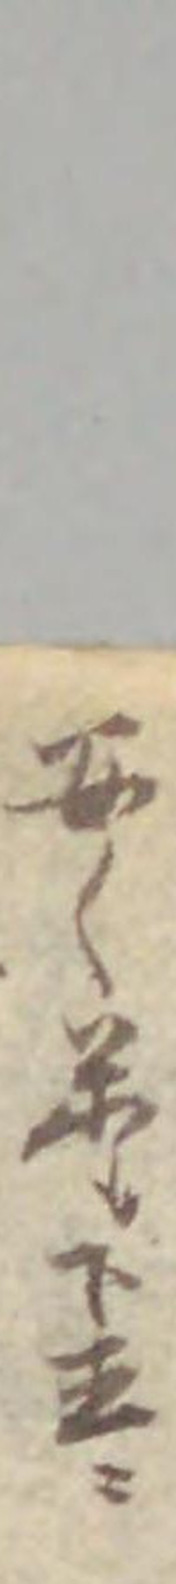安く米も下直二
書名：鶯宿雑記. 巻199-200
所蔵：国立国会図書館 National Diet Library, JAPAN
